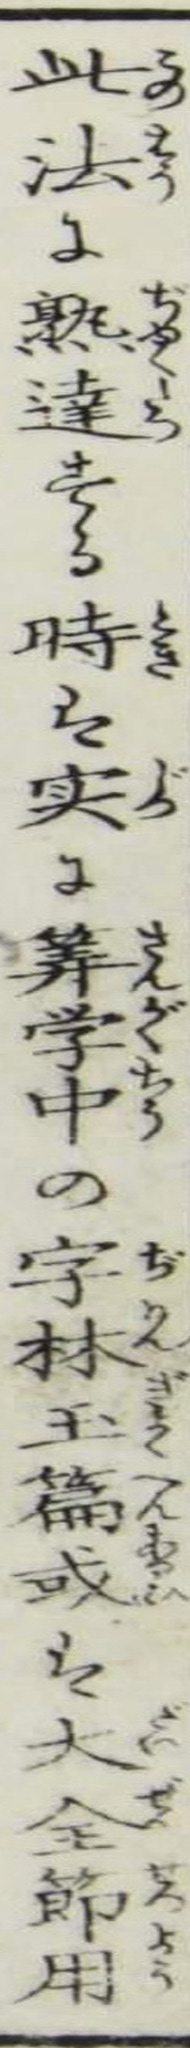此法に熟達する時は実に算学中の字林玉篇或は大全節用
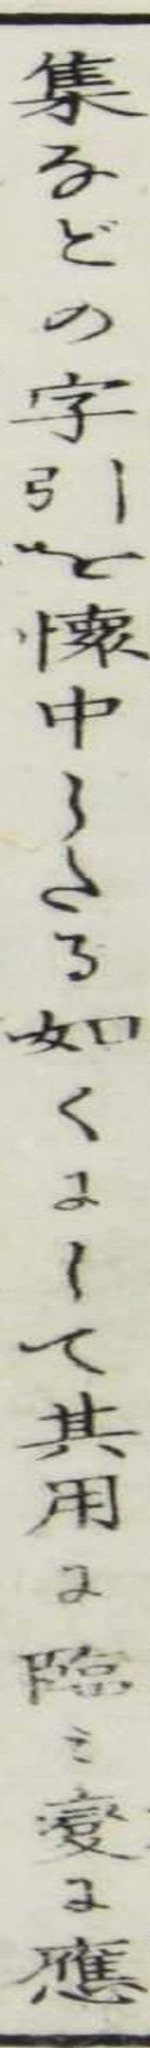集などの字引を懐中したる如くにして其用に臨み変に応
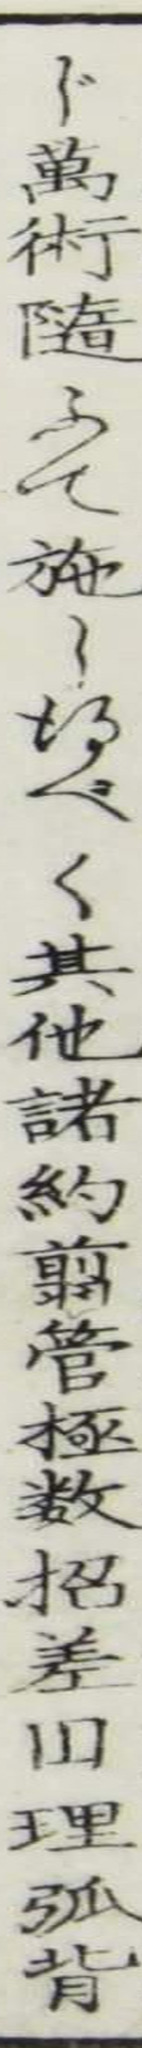じ万術随ふて施し得べく其他諸約翦管極数招差円理弧背
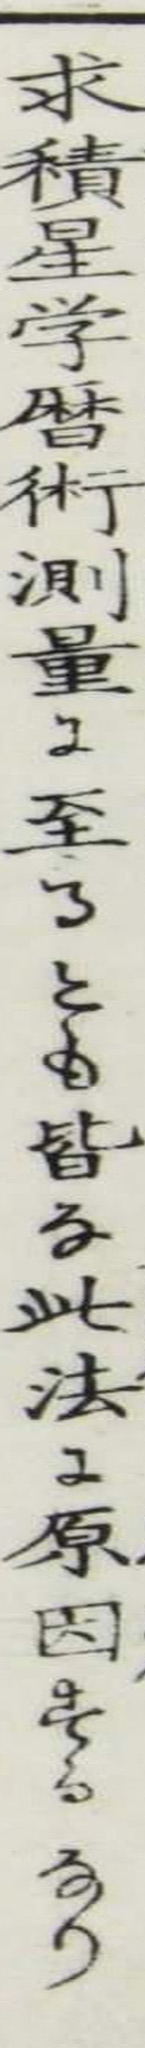求積星学暦術測量に至るとも皆な此法に原因するなり
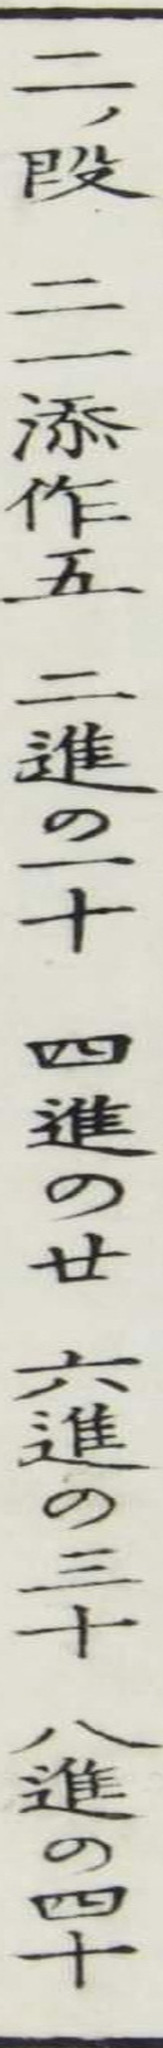二ノ段二一添作五二進の一十四進の廿六進の三十八進の四十
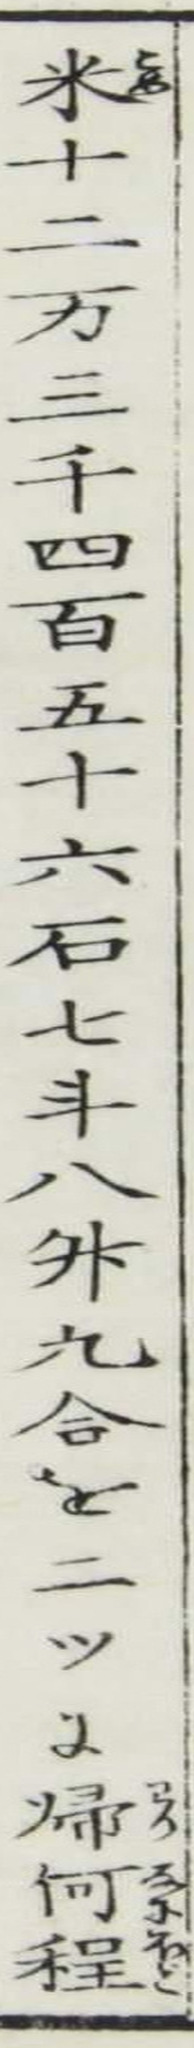米十二万三千四百五十六石七斗八升九合を二ッに帰何程
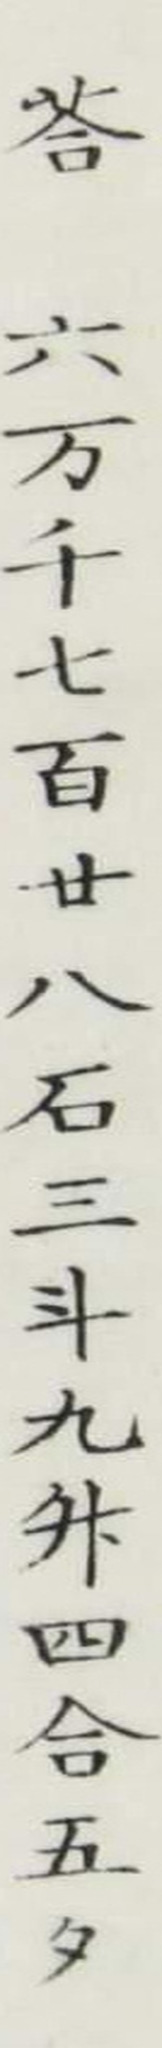答六万千七百廿八石三斗九升五勺
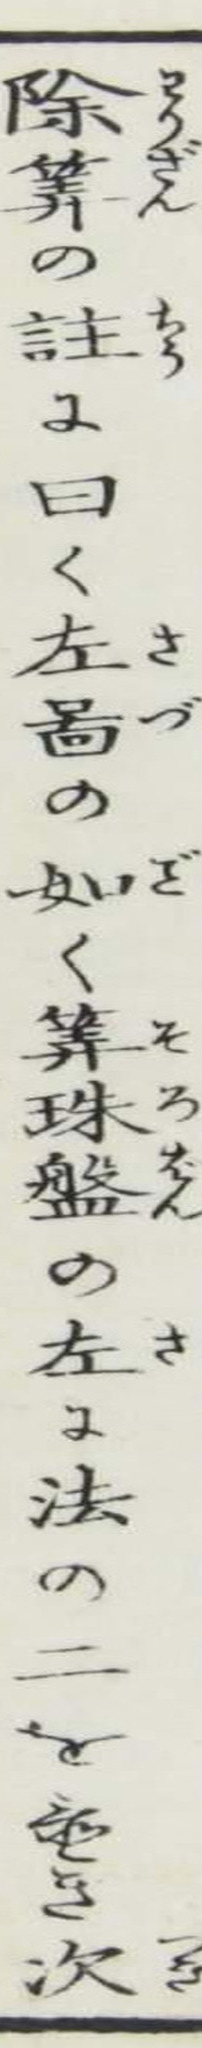除算の註に曰く左図の如く算珠盤の左に法の二を置き次
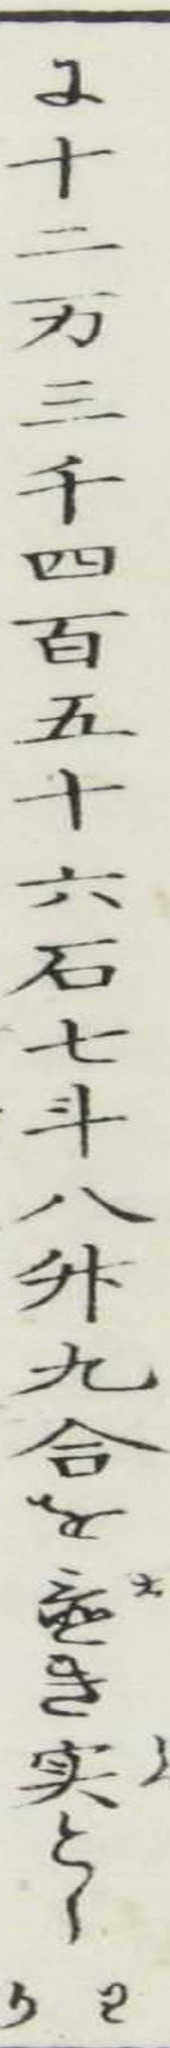に十二万三千四百五十六石七斗八升九合を置き実としわり
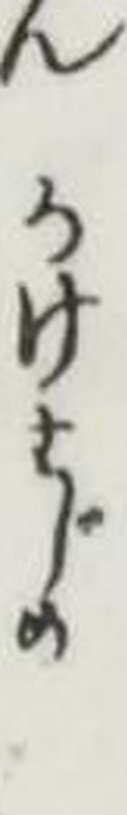わりはじめ
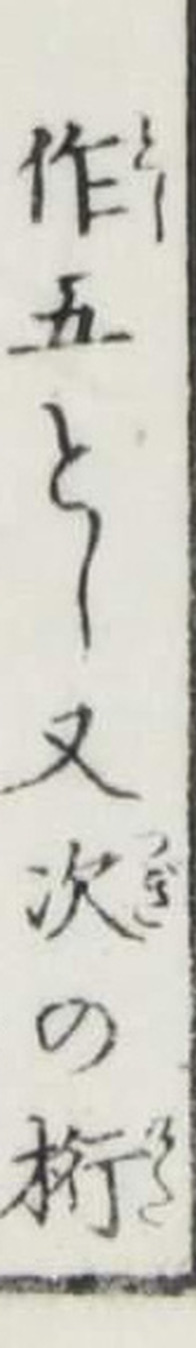作五とし又次の桁
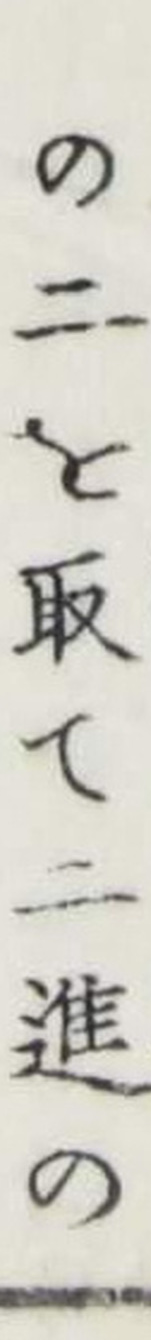の二を取て二進の
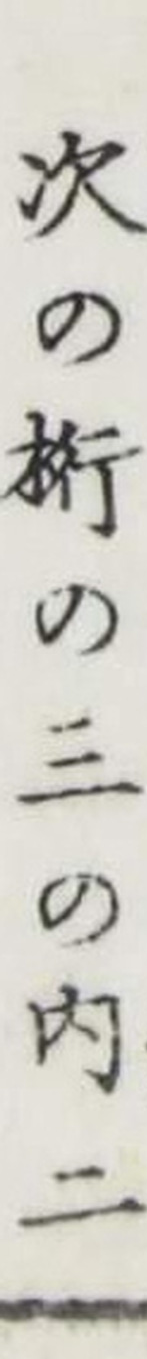次の桁の三の内二
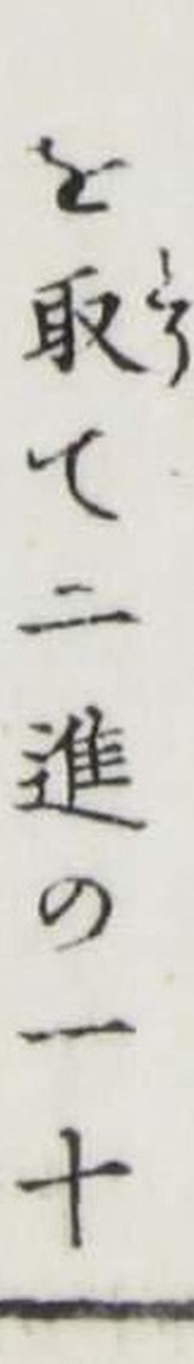を取て二進の一十
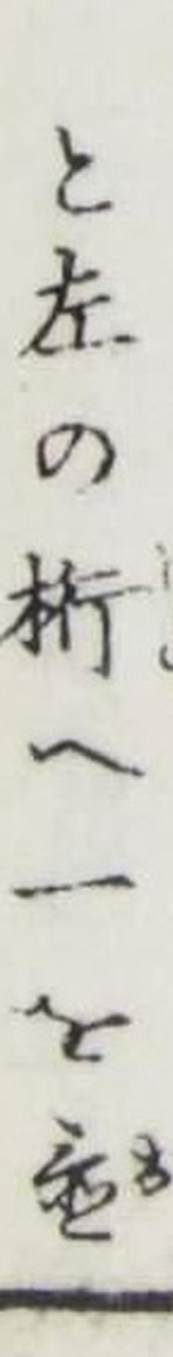と左の桁へ一を置
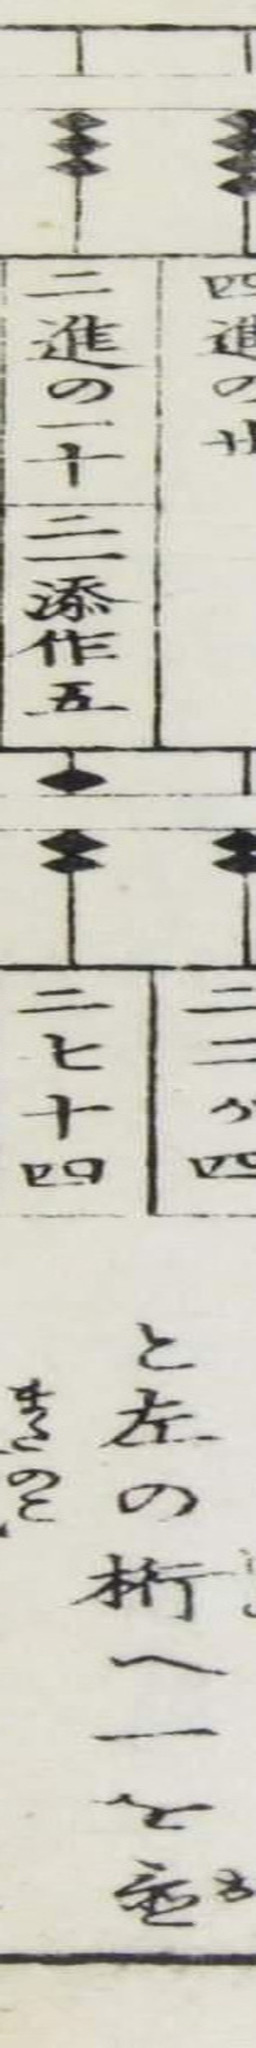二進の一十二一添作五二七十四
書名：明治小學塵劫記 卷1
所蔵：東京学芸大学教育コンテンツアーカイブ
